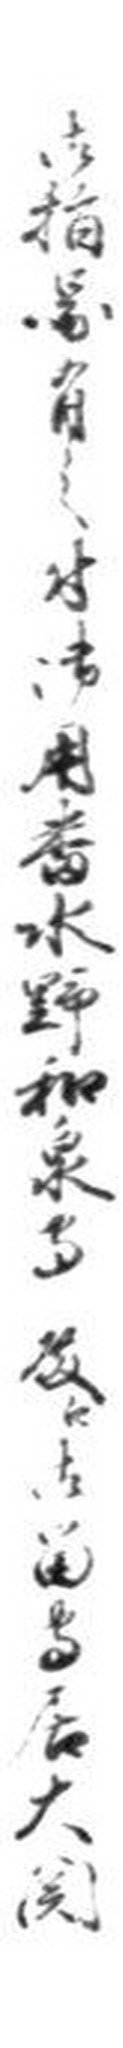御指図有之付御用番水野和泉守殿江御留守居大関
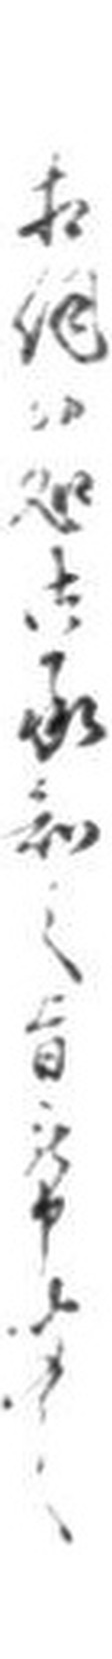相伺候処御承知之旨被申聞之
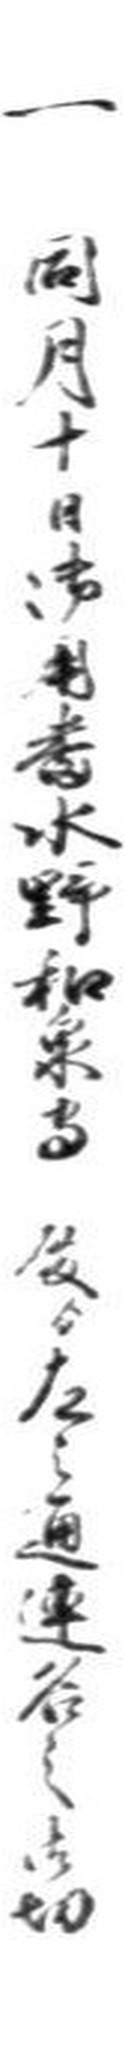一同月十日御用番水野和泉守殿ゟ左之通連名之御切
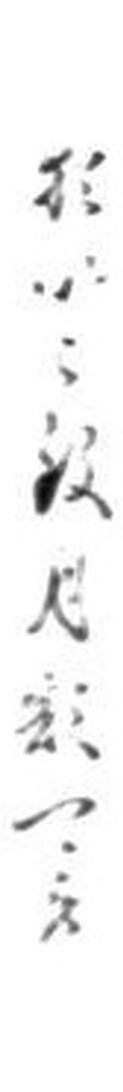猶以被致月額可被
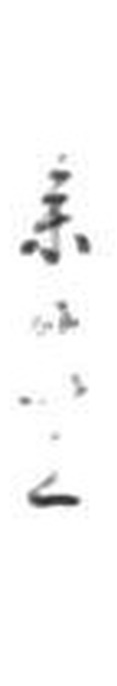参候以上
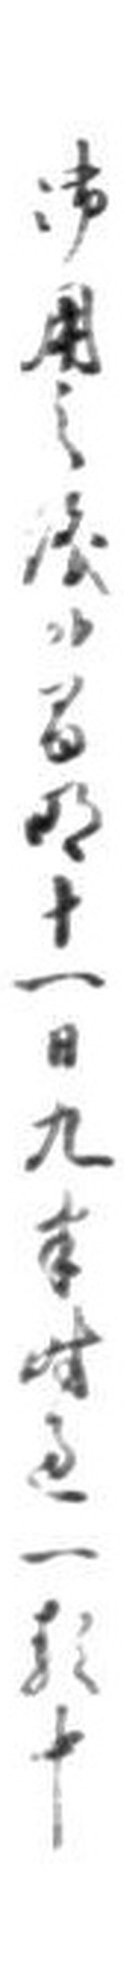御用之儀候間明十一日九半時過一類中
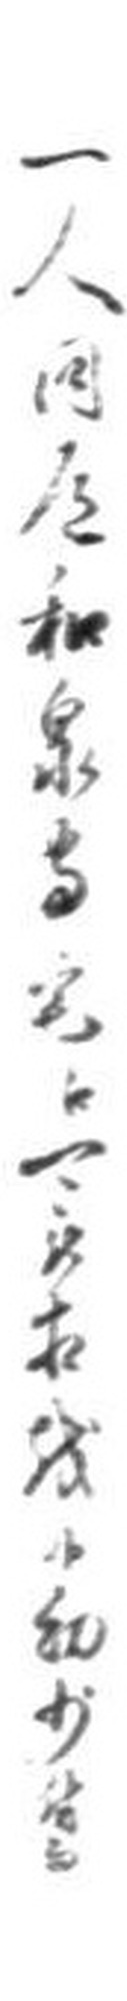一人同道和泉守宅江可被相越候幼少付而
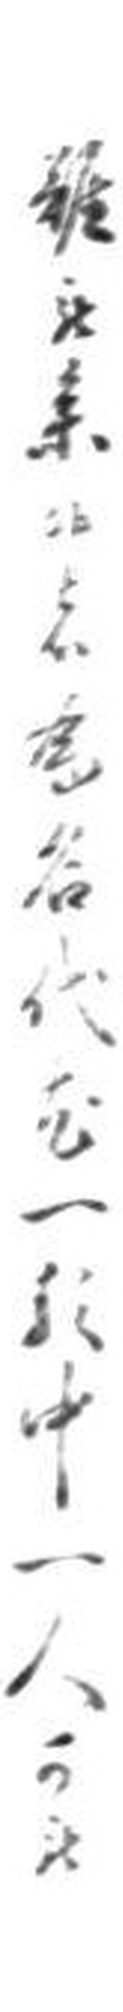難被参候者為名代尤一類中一人可被
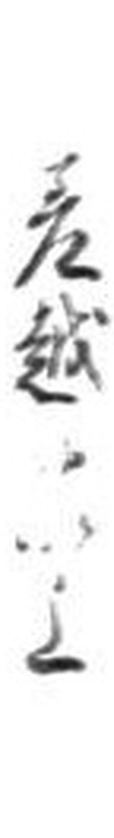差越候以上
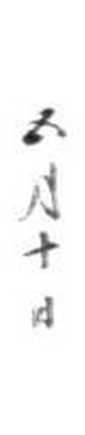五月三日
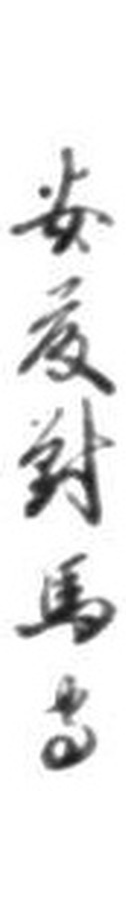安藤対馬守

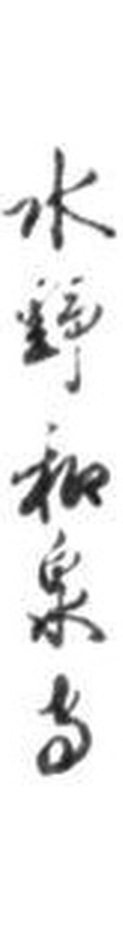水野和泉守
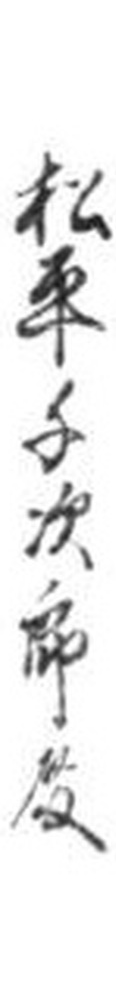松平千次郎殿
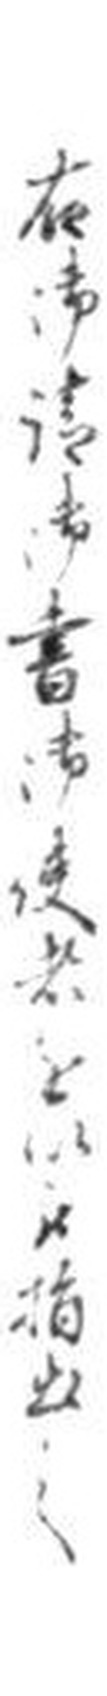右御請御書御使者を以被指出之
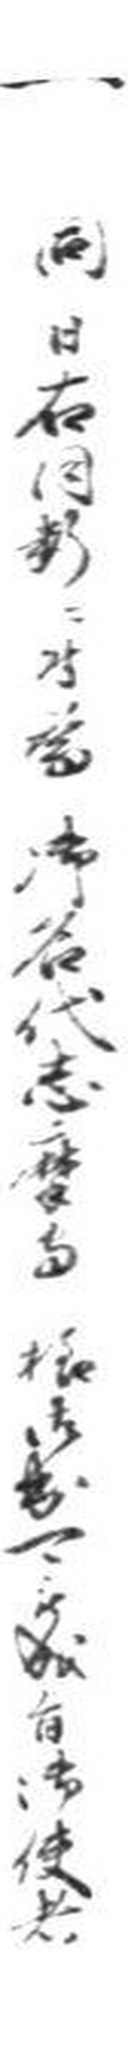一同日右同断ニ付為御名代志摩守様御出可被成旨御使者
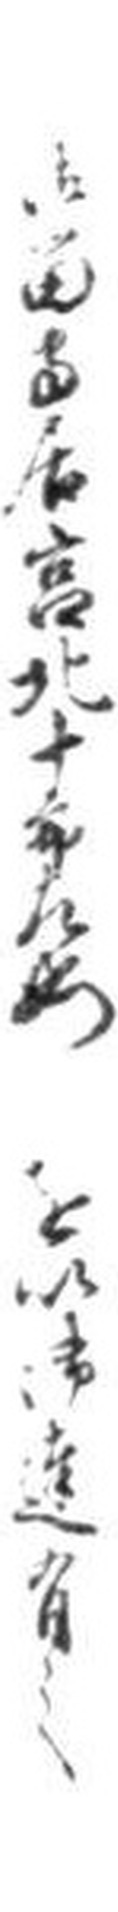御留守居宮北十郎左衛門を以御達有之
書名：家譜 三十七 宗矩公 従正徳五年到享保九年五月
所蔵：福井県文書館 Fukui Prefectural Archives
